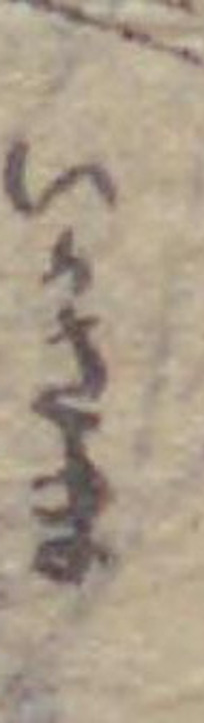いかさま
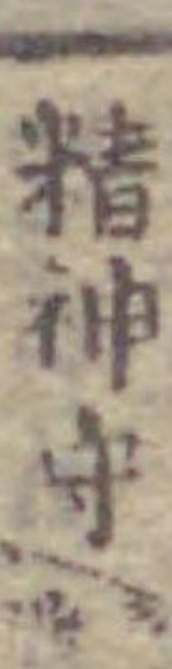精神守
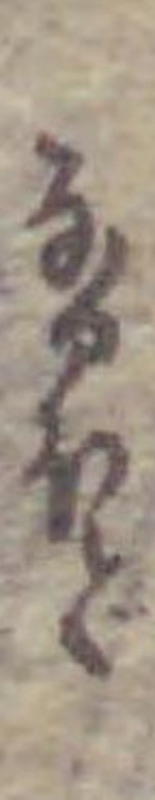なるほど
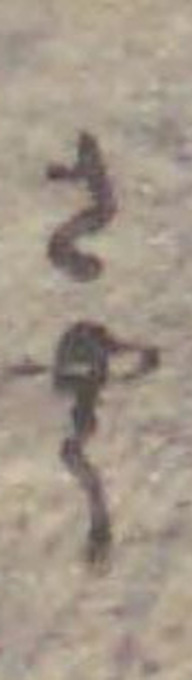さやう
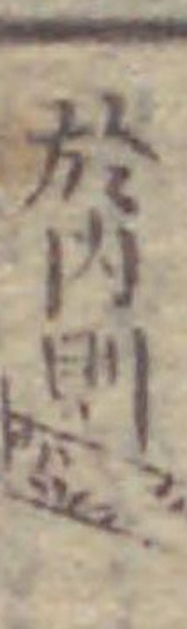於内則
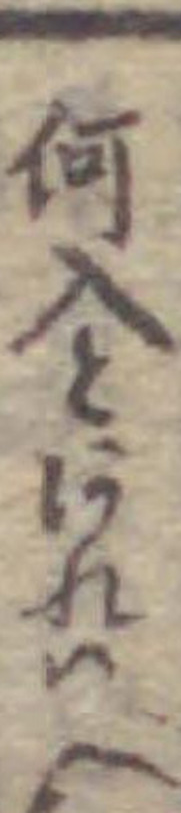何入とあれは
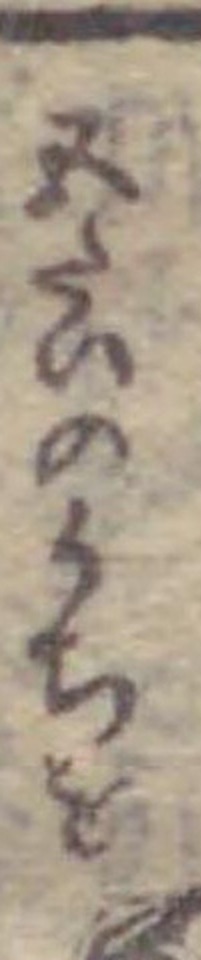五たいのうちを
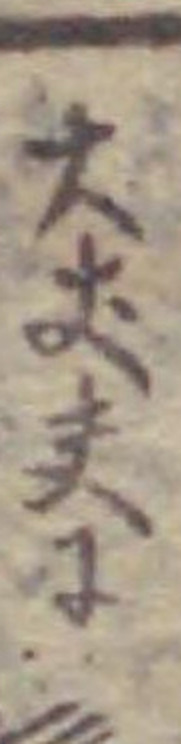大丈夫に
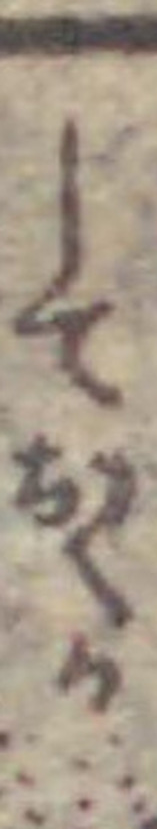しておくか
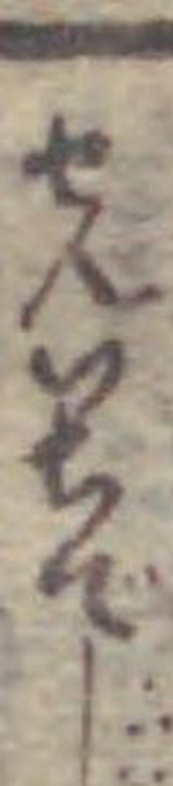せんいちで
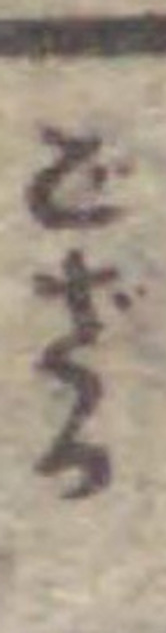ござる
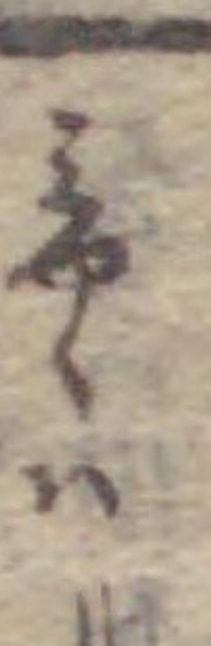みやくは
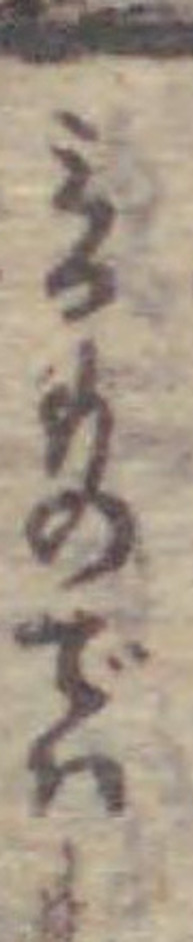みるものでは
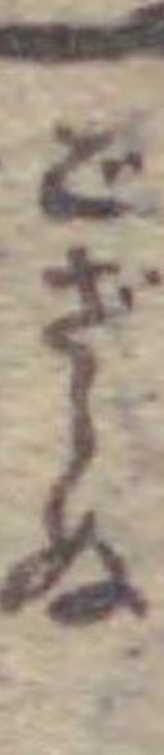ござらぬ
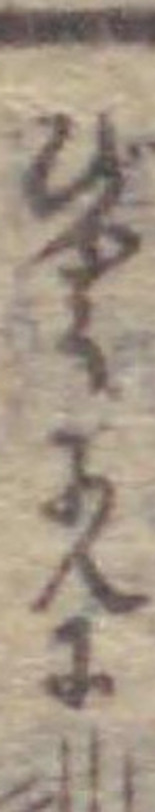びょうにんに
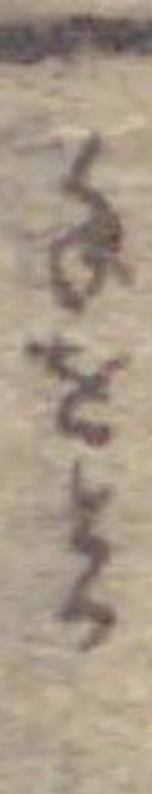手をとる
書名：五躰不具毒解薬 : 3巻
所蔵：国立国会図書館 National Diet Library, JAPAN
